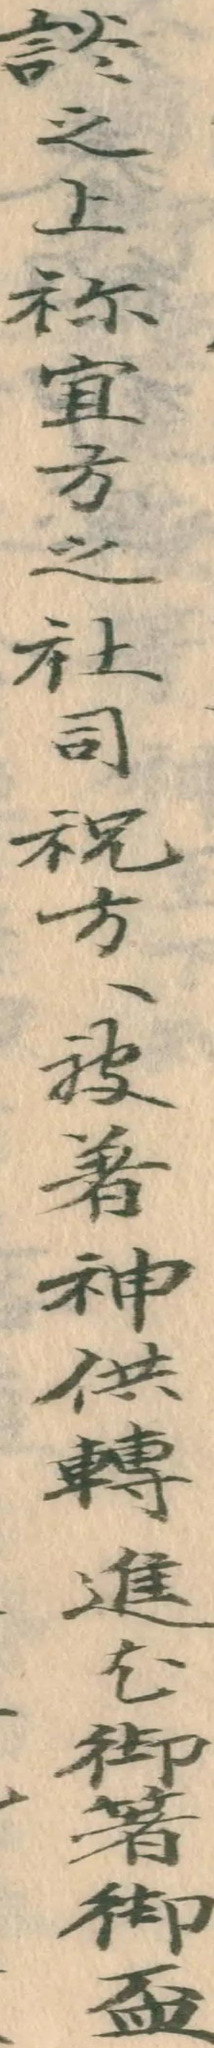談之上祢宜方之社司祝方へ被着神供転進尤御箸御盃
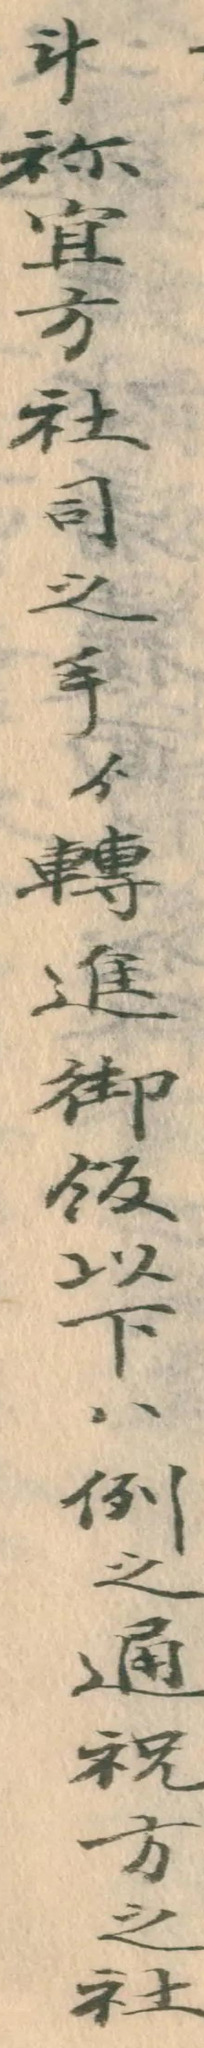計祢宜方社司之手ゟ転進御飯以下ハ例之通祝方之社
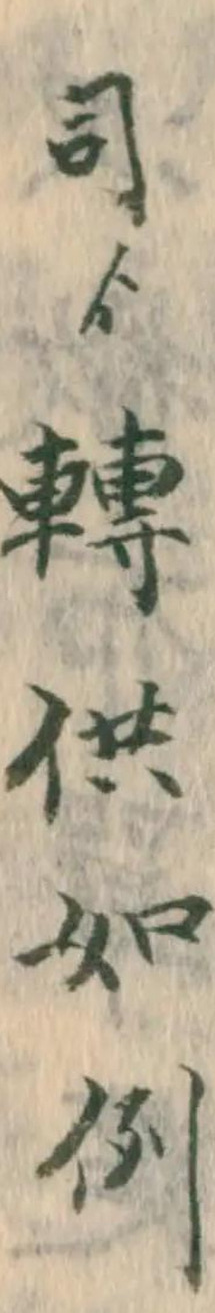司ゟ転供如例
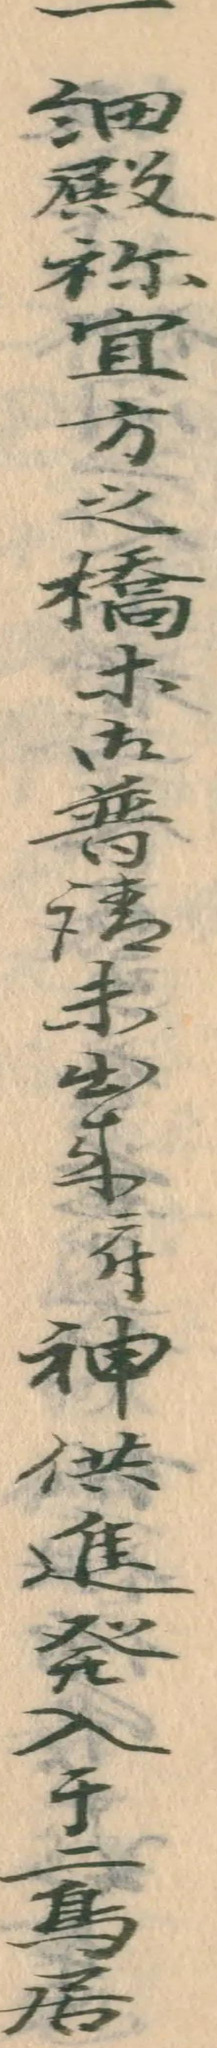一細殿祢宜方之橋等御普請未出来ニ付神供進発入于二鳥居
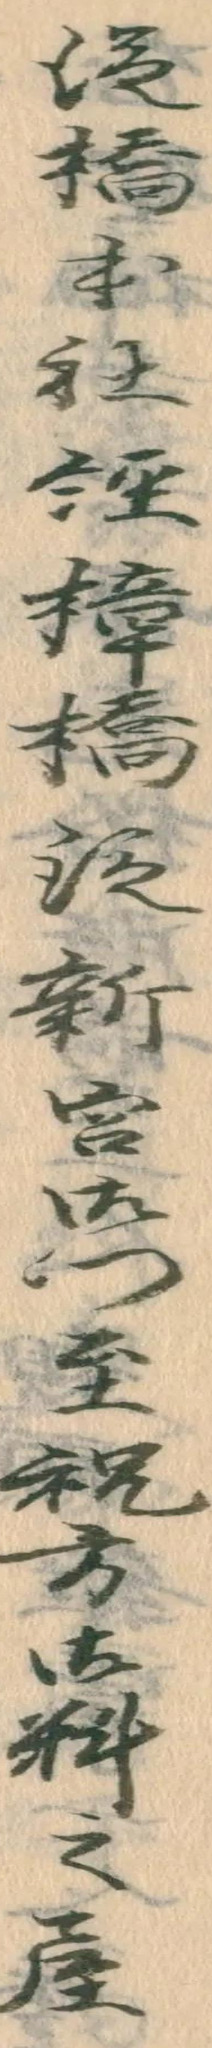従橋本社経樟橋従新宮御門至税方御料之屋
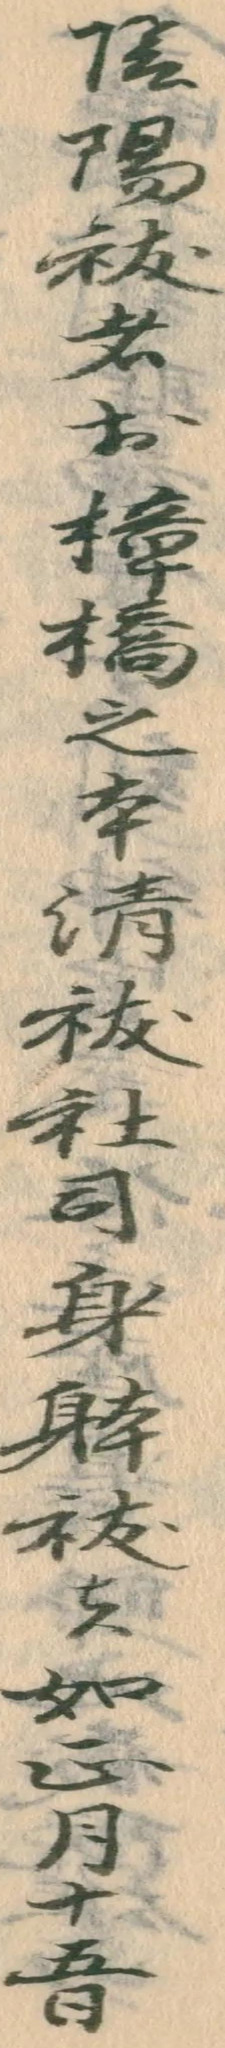陰陽祓は於樟橋之本清祓社司身体祓は如正月十五日
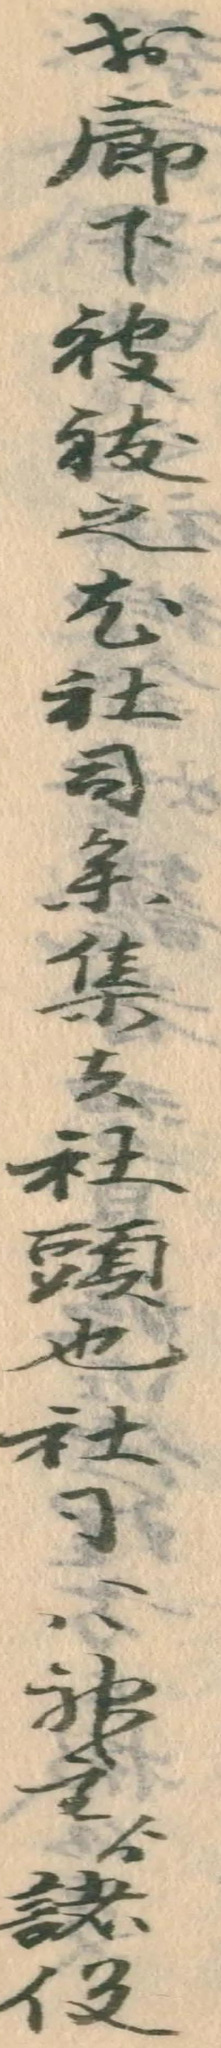於廊下被祓之尤社司参集者社頭也社司ヘハ神主ゟ諸役
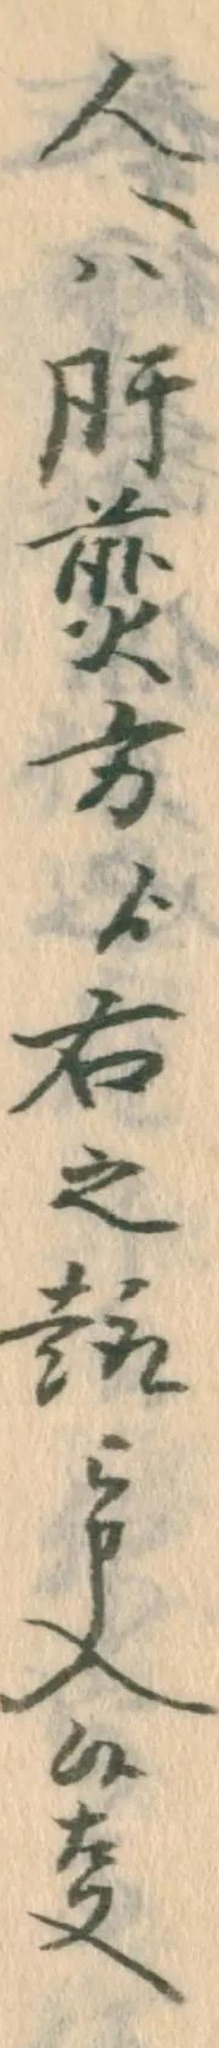人ヘハ肝煎方ゟ右之趣被申入候事
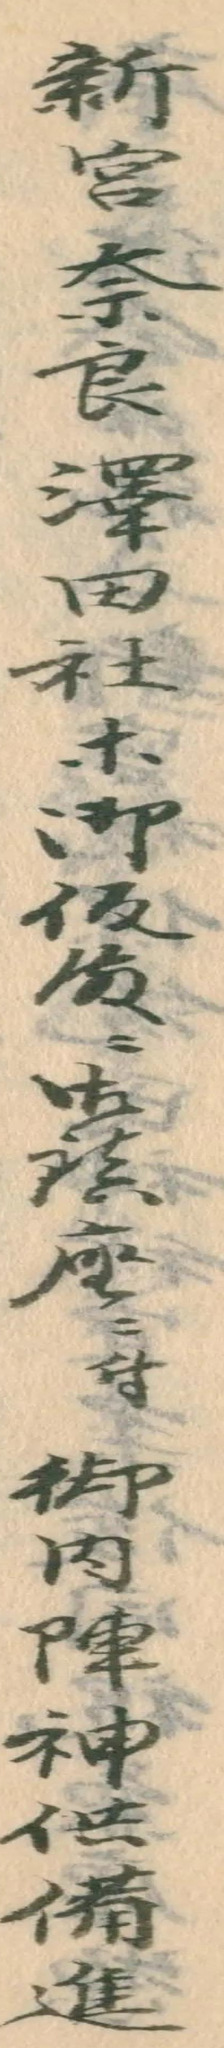一新宮奈良沢田社等御仮殿ニ御鎮座ニ付御内陣神供備進
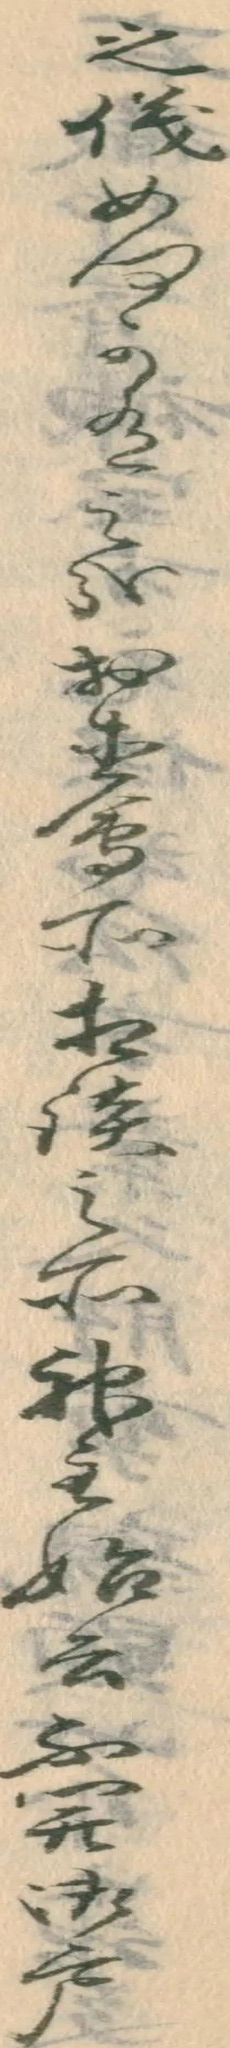之儀如何可有之哉於直会所相談之所神主始云不開御戸
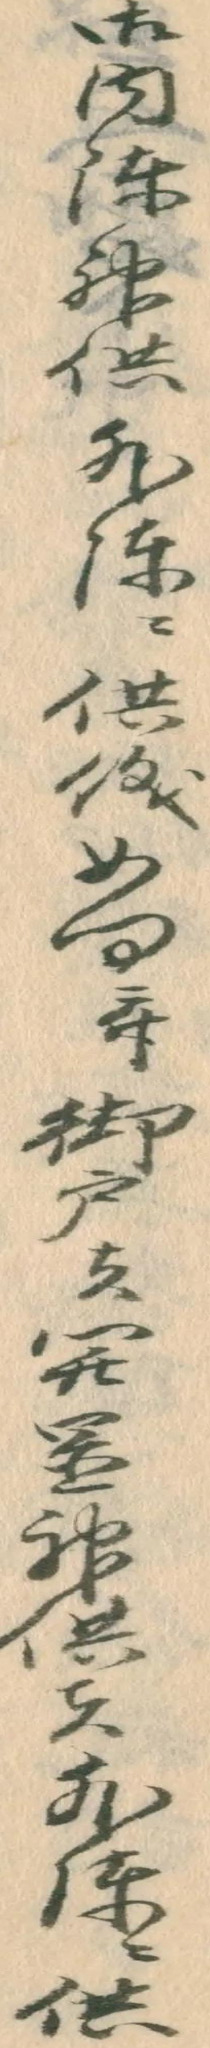御内陣神供外陣ニ供儀如何并御戸は開置神供は外陣ニ供
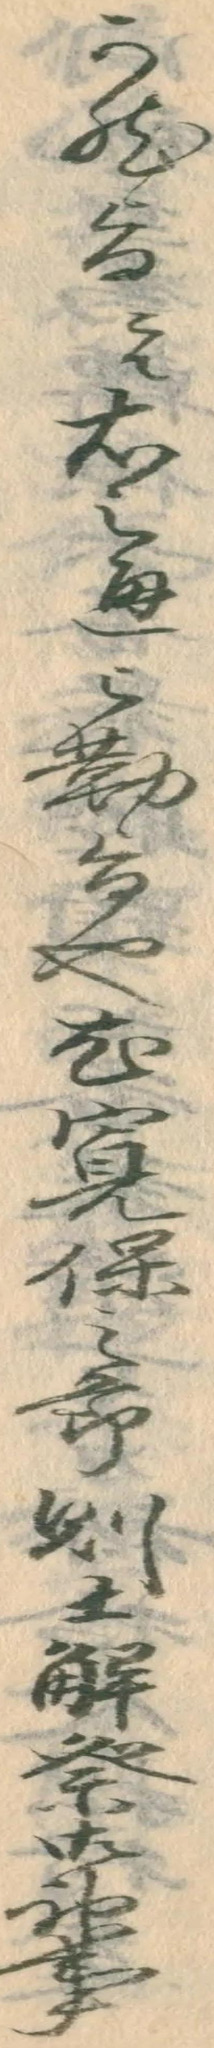可然旨ニて右之通被勤旨也尤寛保之節則土解祭御神事
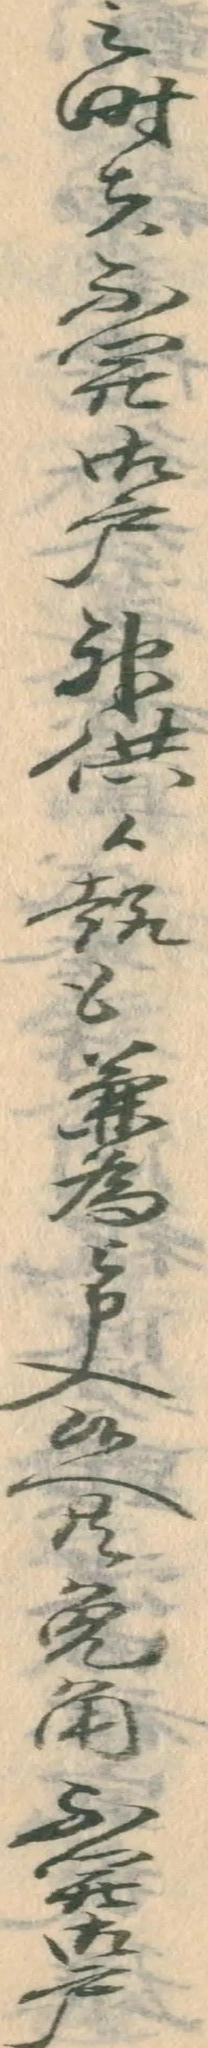之時は不開御戸神供候趣も兼為被申入候へ共兎角不開御戸
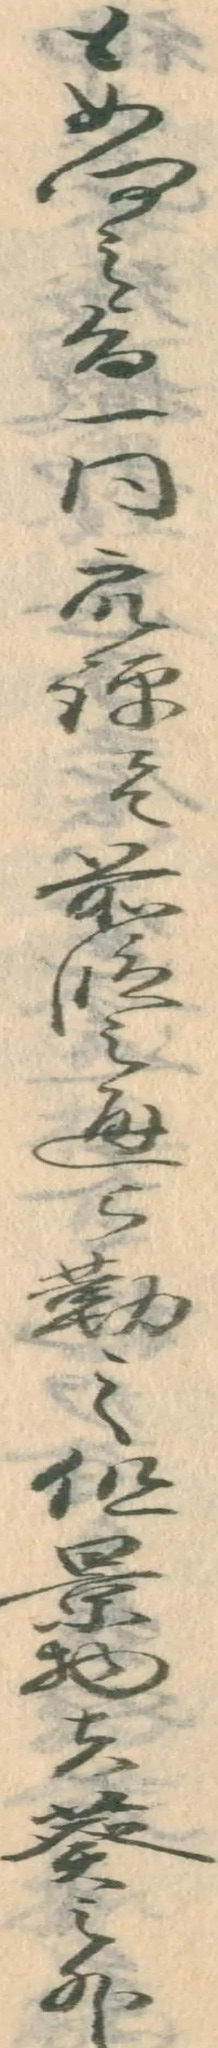も如何之旨一同衆評ニて前段之通被勤之但景物は葵之外
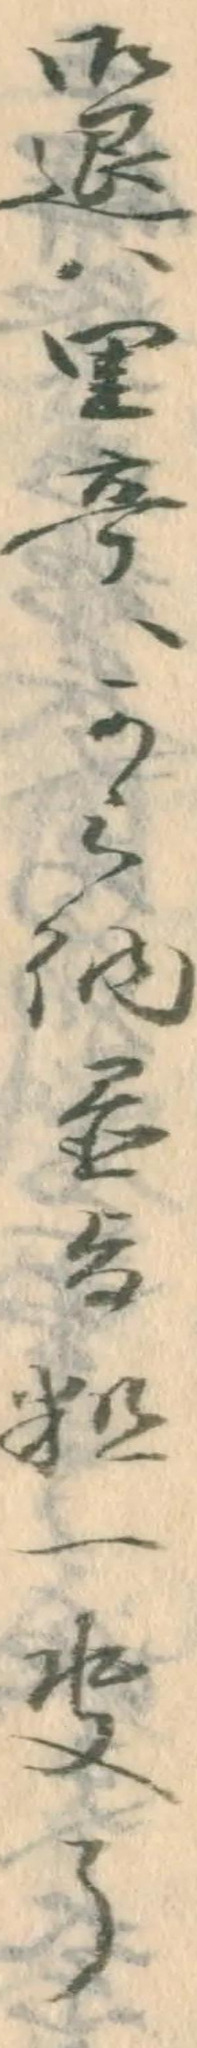御退ハ里亭へ可被納置旨粗一決了

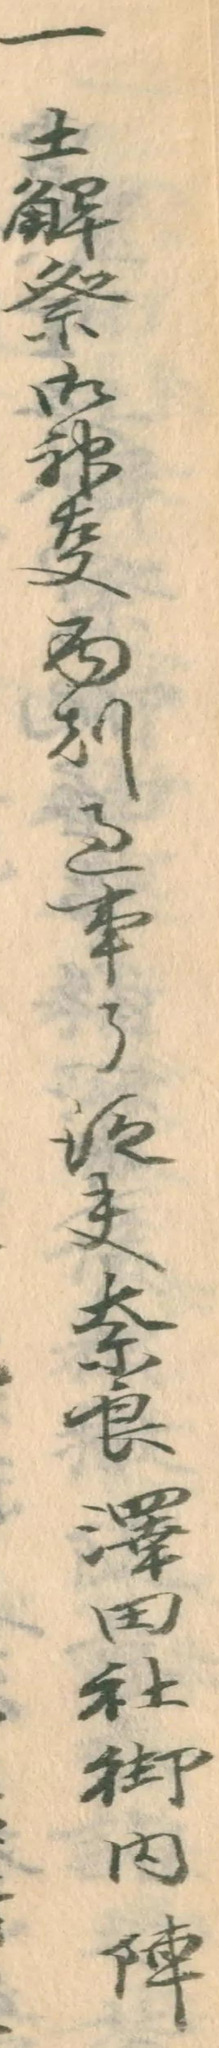一土解祭御神事酉刻過事了従夫奈良沢田社御内陣
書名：賀茂社記録. 第17冊
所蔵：国立国会図書館 National Diet Library, JAPAN
